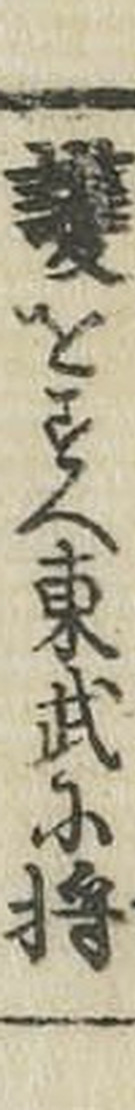護をすへ東武に将
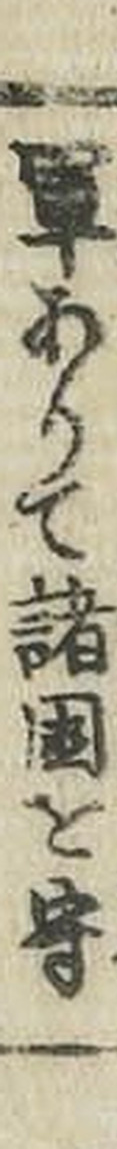軍ありて諸国を守
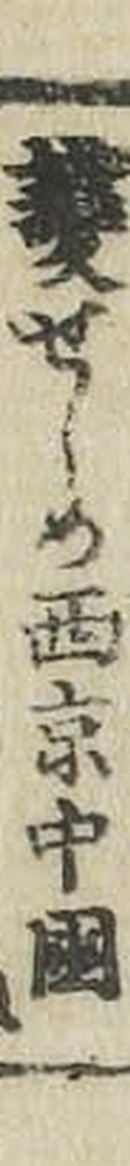護せしめ西京中国に
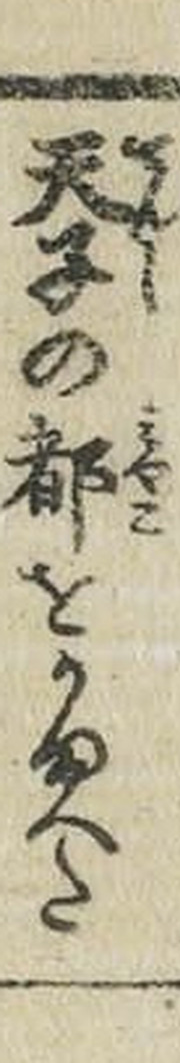天子の都をかまへた
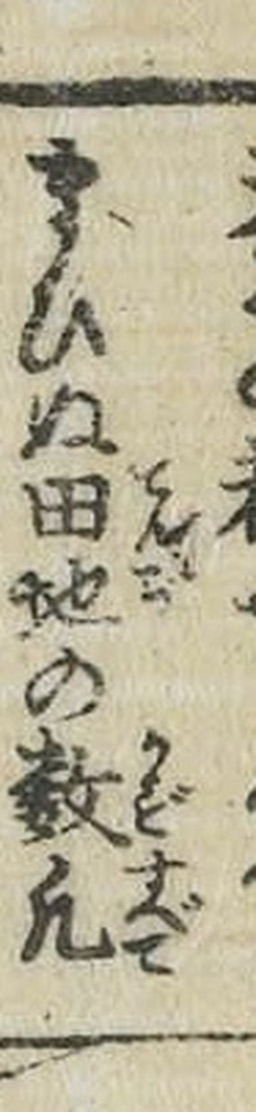まひぬ田地の数凡
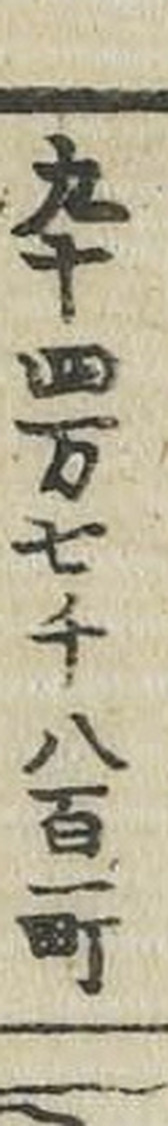九十四万七千八百一町
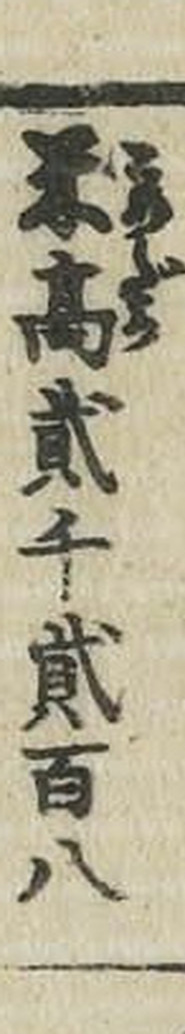米高弐千弐百八
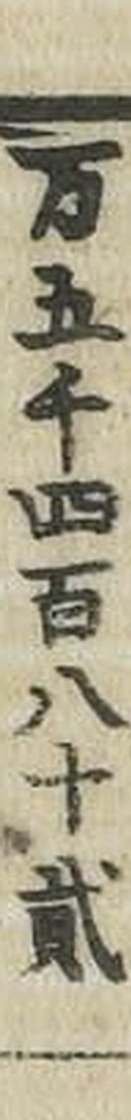万五千四百八十弐
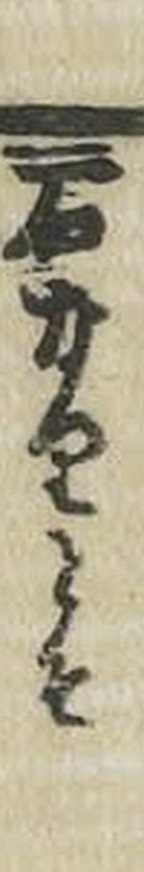石なりとそ
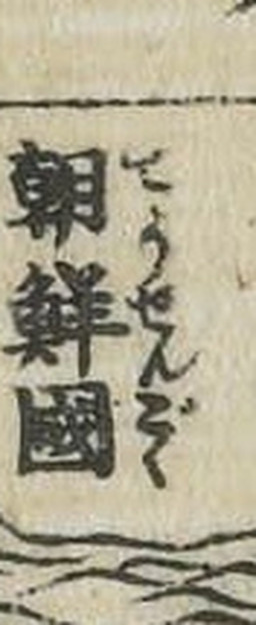朝鮮国

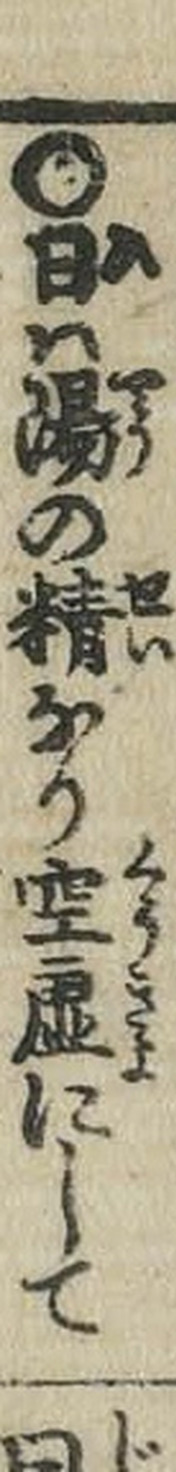○日は陽の精なり空虚にして
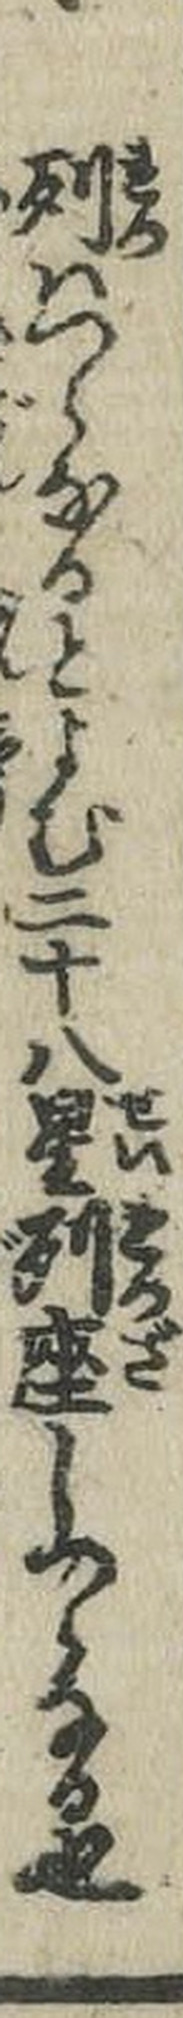列はつらなるとよむ二十八星列座しつらなる也
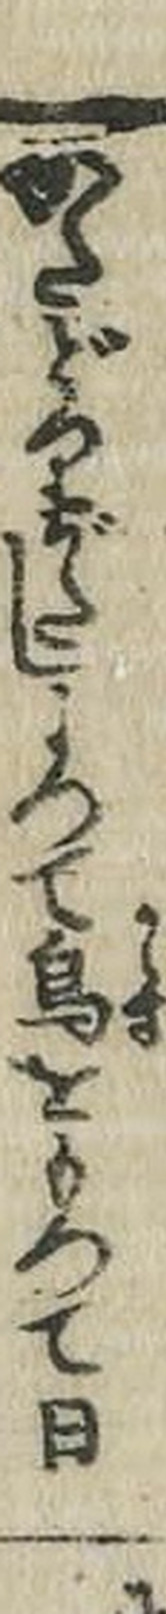かたどりがたしよつて烏をもつて日
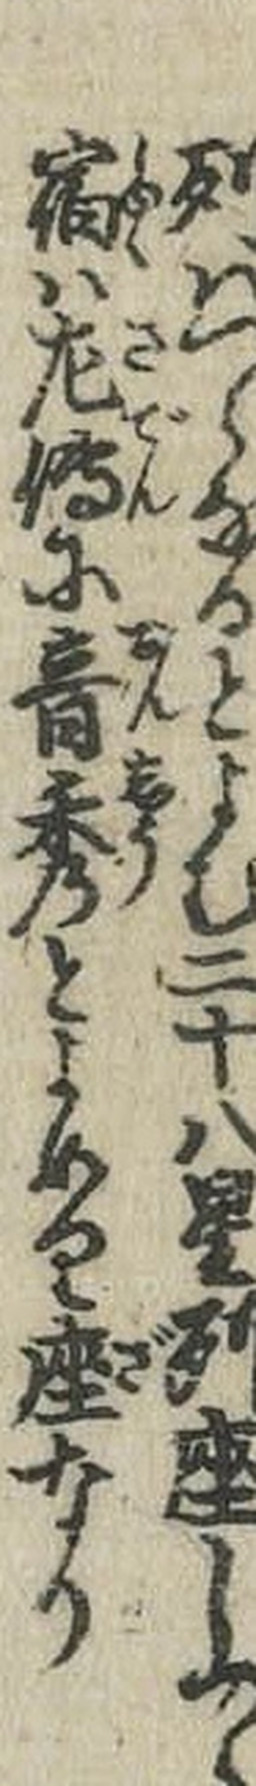宿は左伝に音秀とよめり座なり。
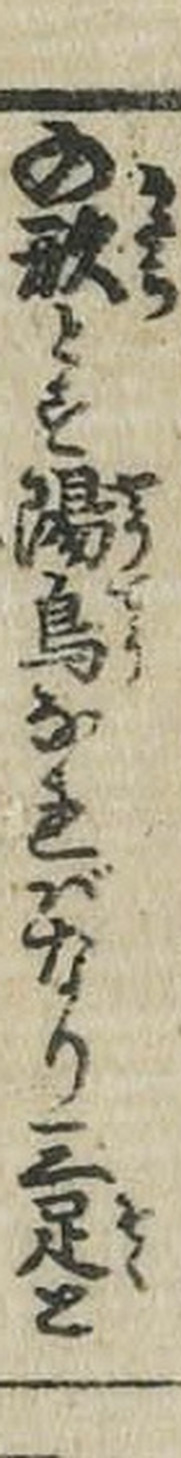の形とす陽鳥なればなり三足と
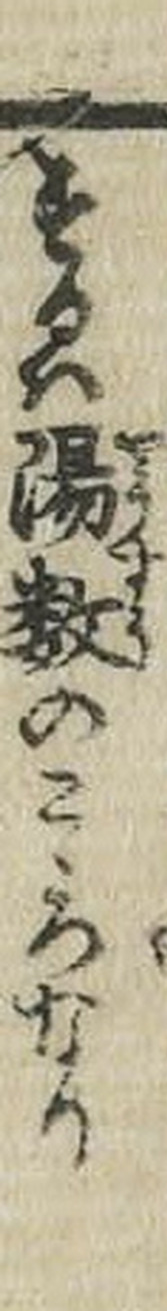するは陽数のこゝろなり
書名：増補頭書訓蒙図彙大成 10巻 2:巻之1-3
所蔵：東京学芸大学教育コンテンツアーカイブ
